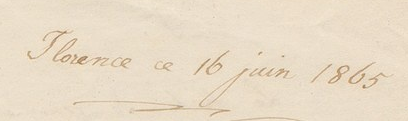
Florence ce 16 juin 1865
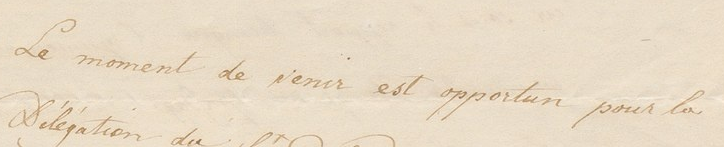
Le moment de venir est opportun pour la
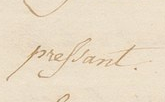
pressant.
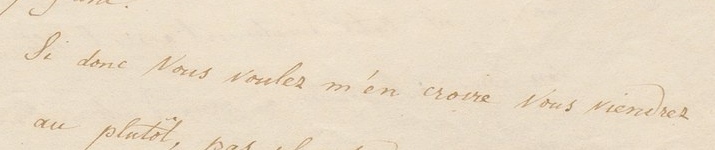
Si donc vous voulez m'en croire vous viendrez
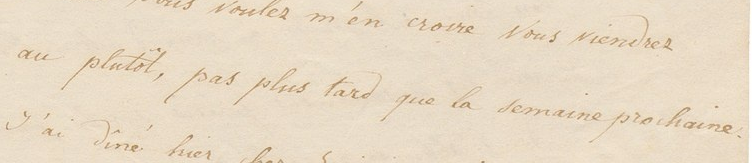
au plutôt, pas plus tard que la semaine prochaine.
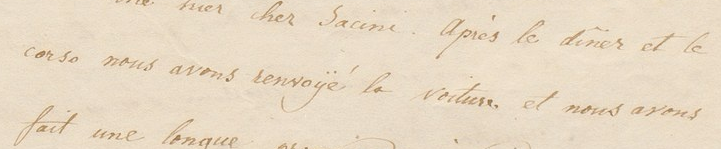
corso nous avons renvoyé la voiture et nous avons
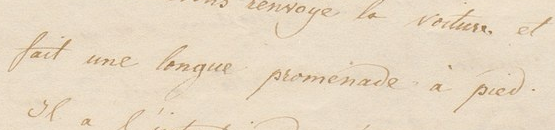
fait une longue promenade à pied.
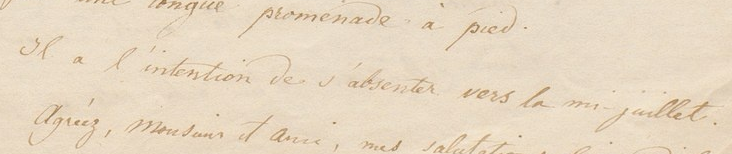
Il a l'intention de s'absenter vers la mi-juillet.
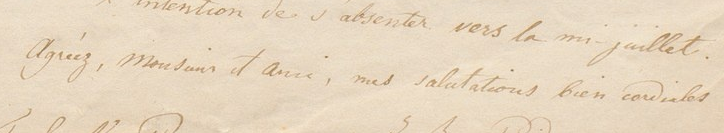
Agréez, Monsieur et Ami, mes salutations bien cordiales
